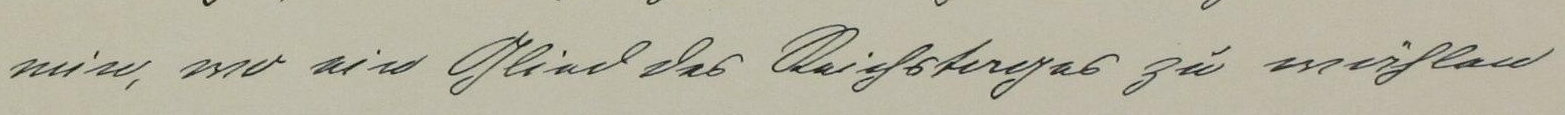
min, wo ein Glied des Reichstages zu wählen
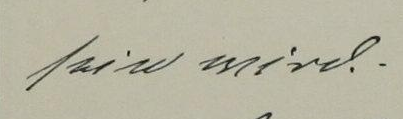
sein wird.
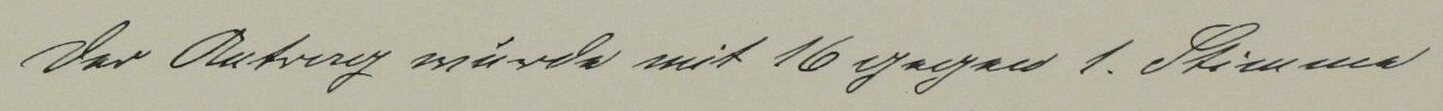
Der Antrag wurde mit 16 gegen 1. Stimme
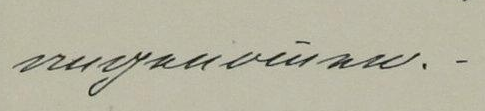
angenommen.
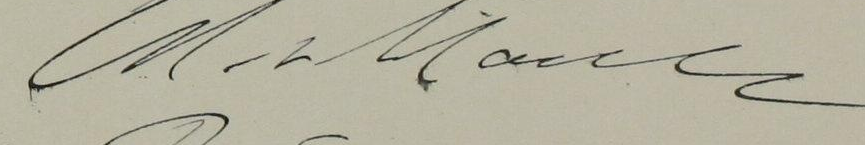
Ed. v. Stackelberg
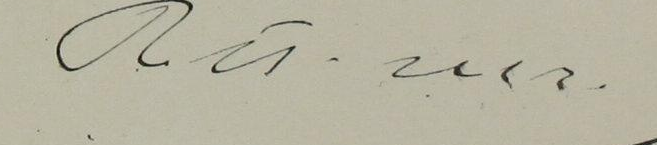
Ritt. secr.
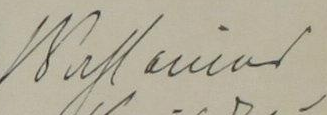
Wahl eines
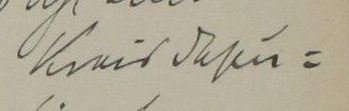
Kreisdepu-
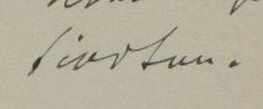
tierten.
